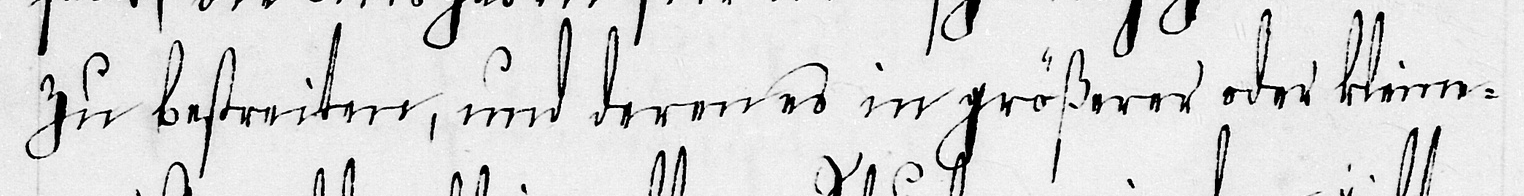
zu bestreiten, und deren es in größerer oder kleine¬
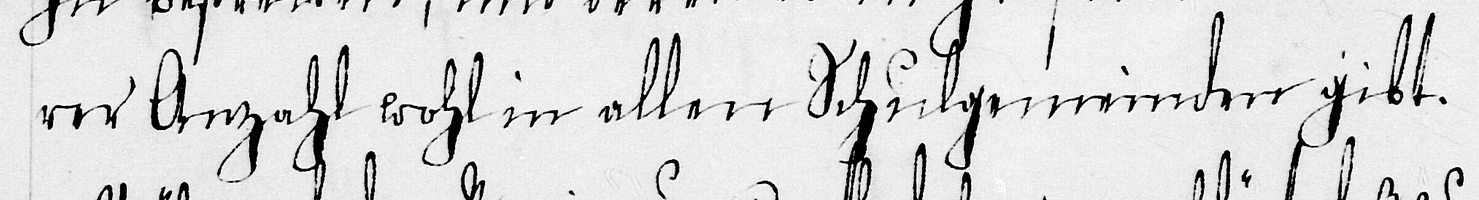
rer Anzahl wohl in allen Schulgemeinden gibt.
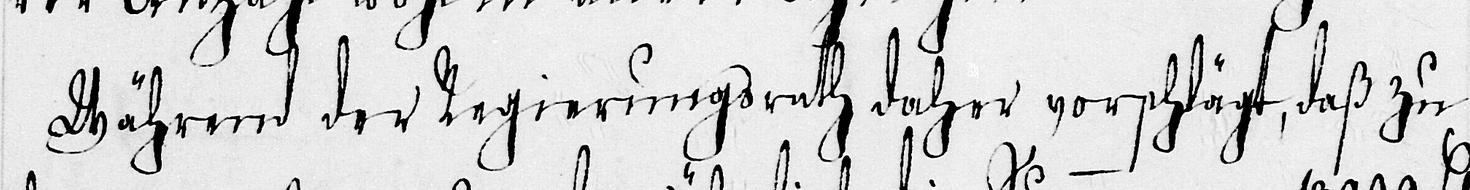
Während der Regierungsrath daher vorschlägt, daß zu
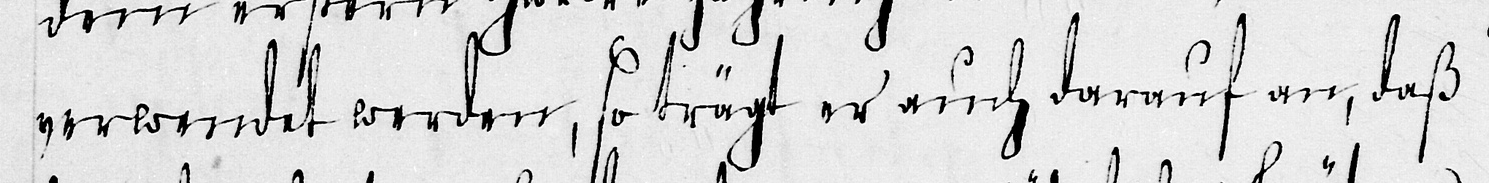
verwendet werden, so trägt er auch darauf an, daß
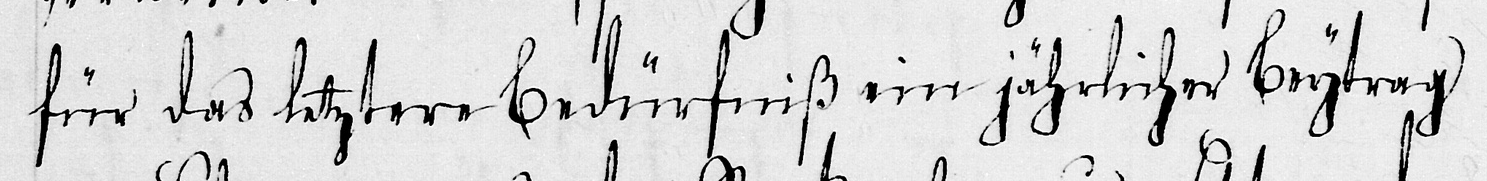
für das letztere Bedürfniß ein jährlicher Beytrag
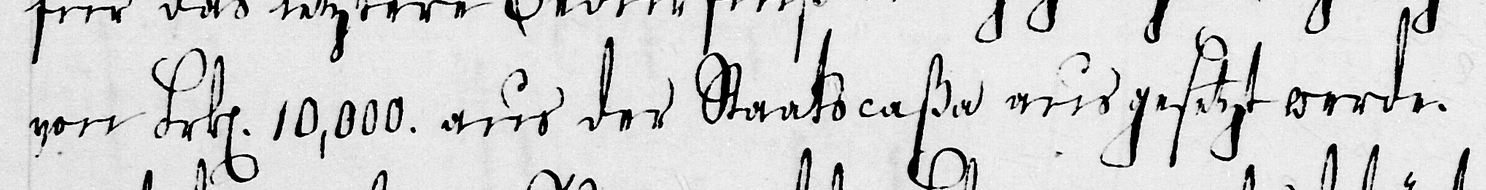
von Frk[en]. 10,000. aus der Staatscaßa ausgesetzt werde.
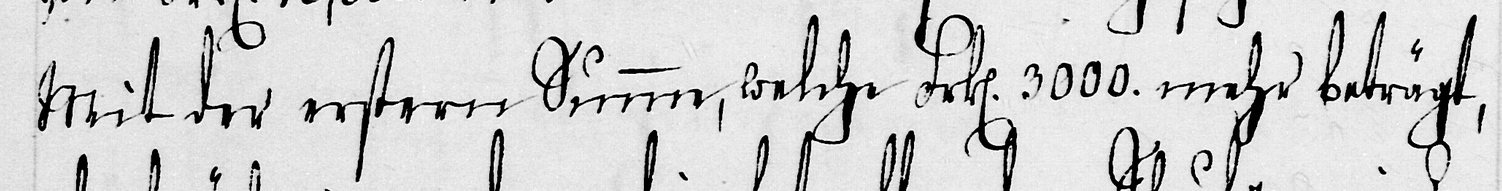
Mit der erstern Summe, welche Frk[en]. 3000. mehr beträgt,
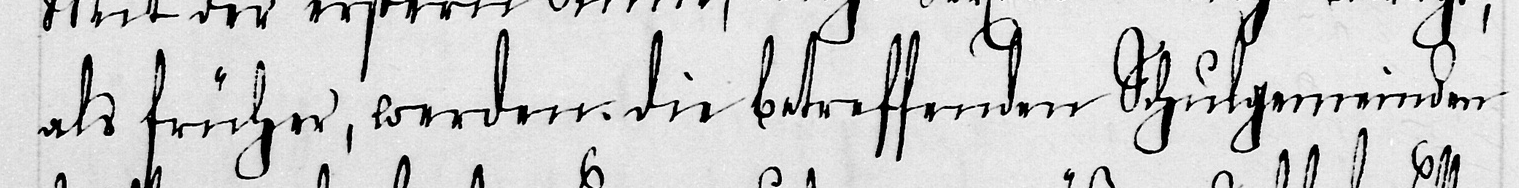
als früher, werden die betreffenden Schulgemeinden
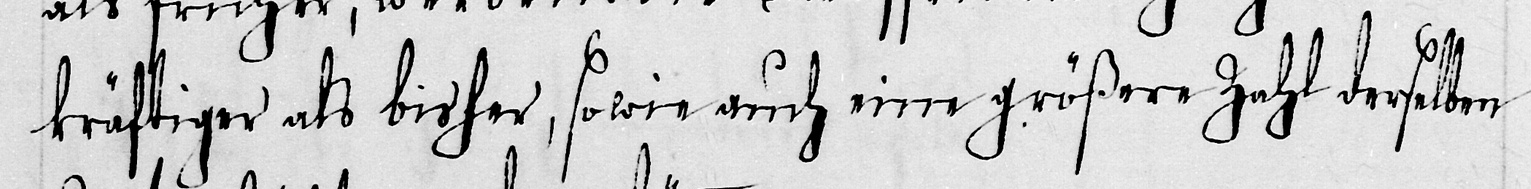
kräftiger als bisher, sowie auch eine größere Zahl derselben
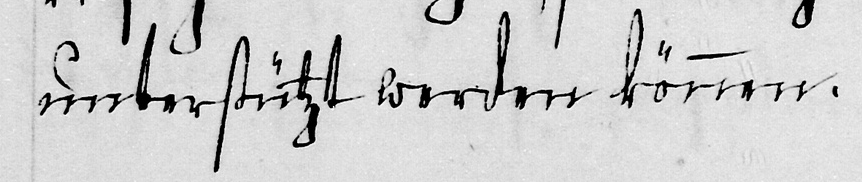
unterstützt werden können.
